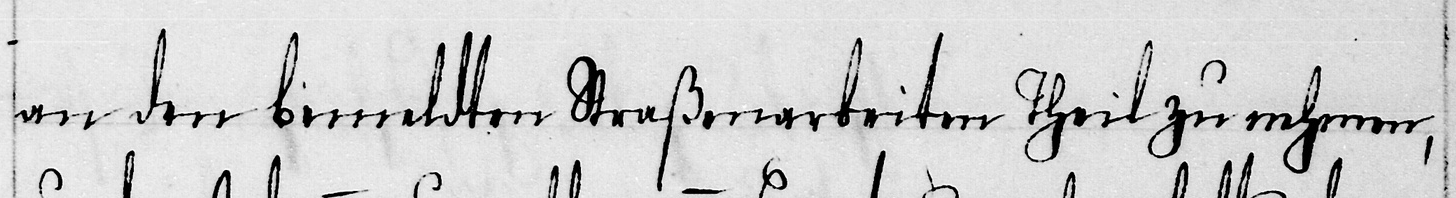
an den bemeldten Straßenarbeiten Theil zu nehmen,
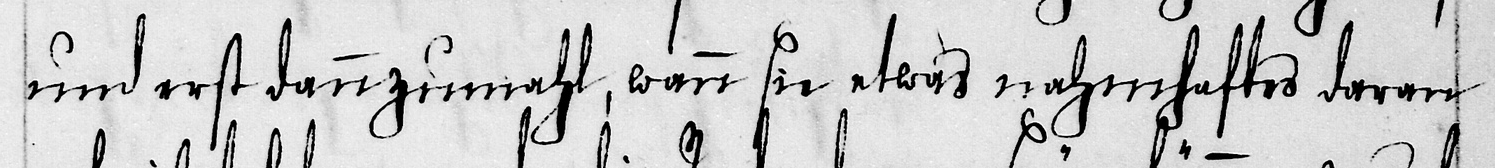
und erst dannzumahl, wann sie etwas nahmhaftes daran
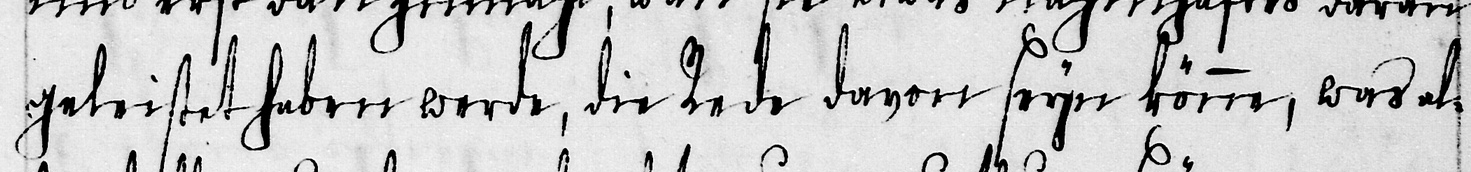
geleistet haben werde, die Rede davon seyn könne, was al¬
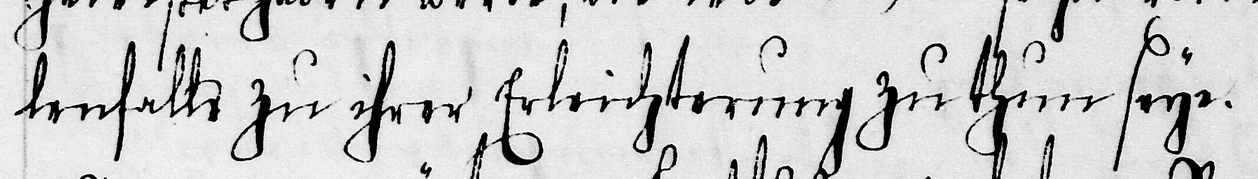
lenfalls zu ihrer Erleichterung zu thun seye.
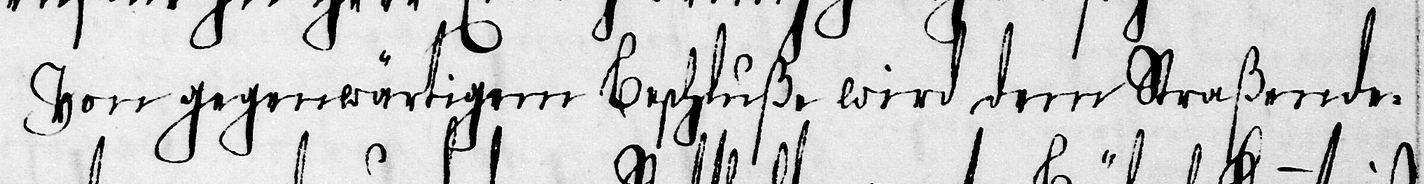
Von gegenwärtigem Beschluße wird dem Straßende¬
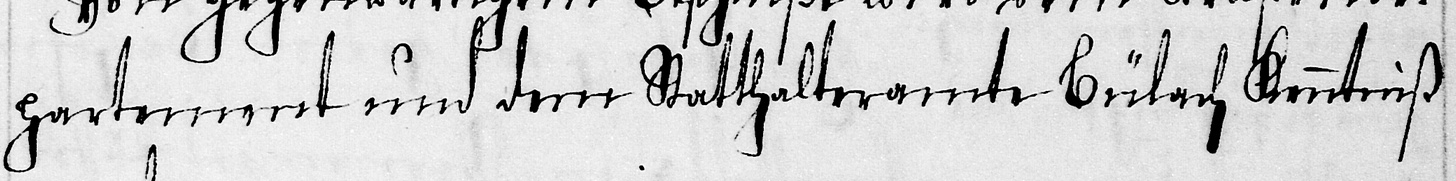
partement und dem Statthalteramte Bülach Kenntniß
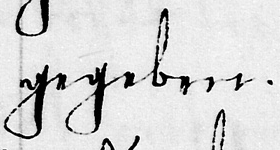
gegeben.
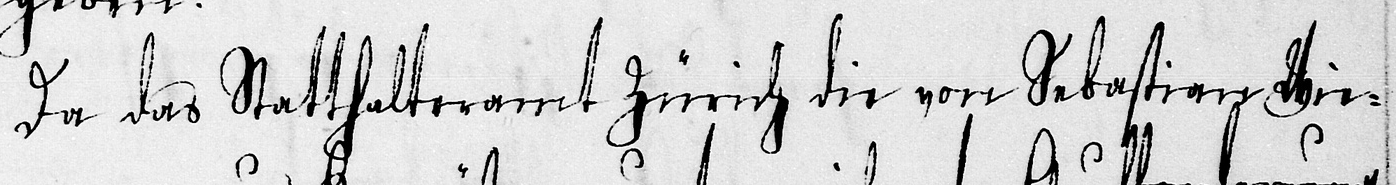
Da das Statthalteramt Zürich die von Sebastian Wie¬
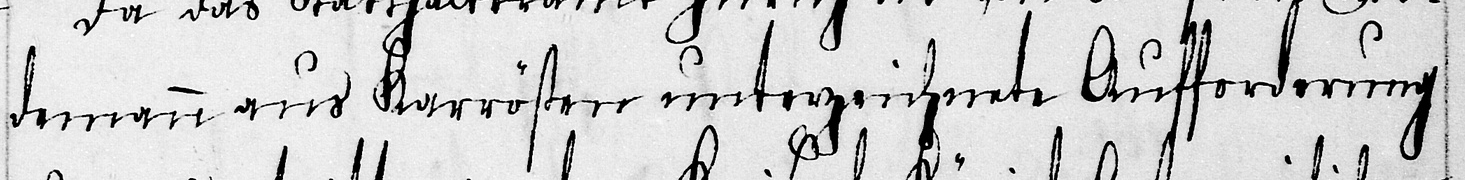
demann aus Karrösten unterzeichnete Aufforderung
